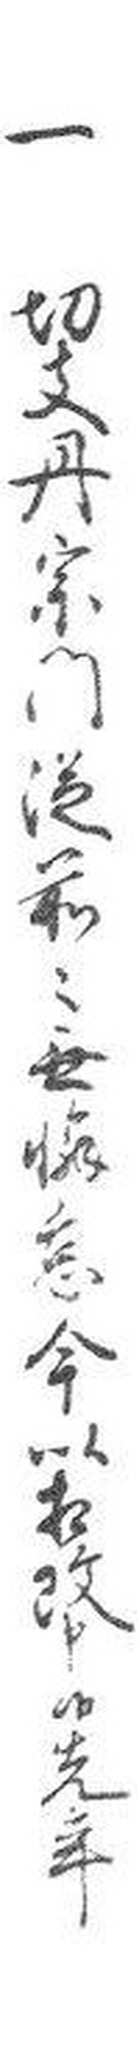一切支丹宗門従前々無懈怠今以相改申候先年
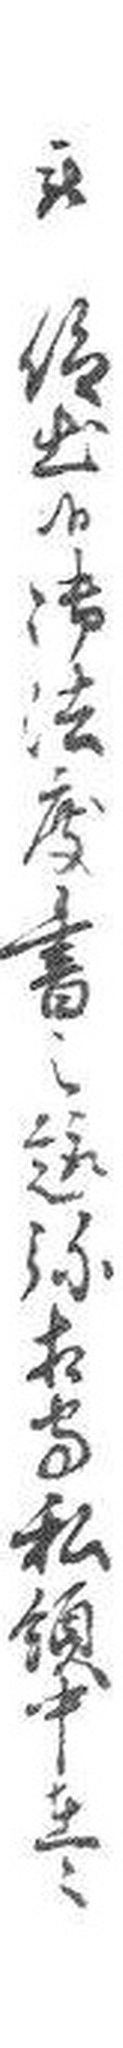被仰出候御法度書之趣弥相守私領中在々
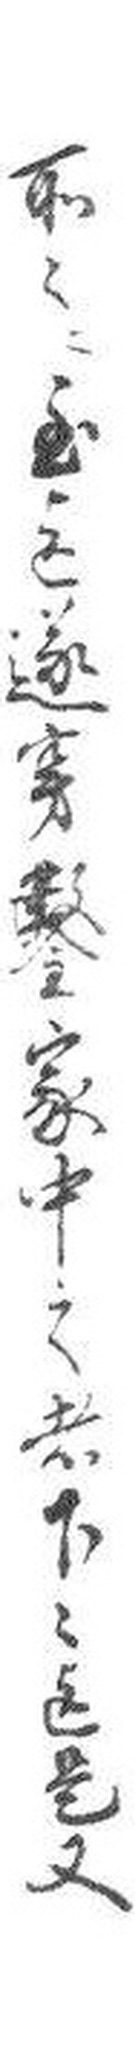所々ニ至迄遂穿鑿家中之者下々迄是又
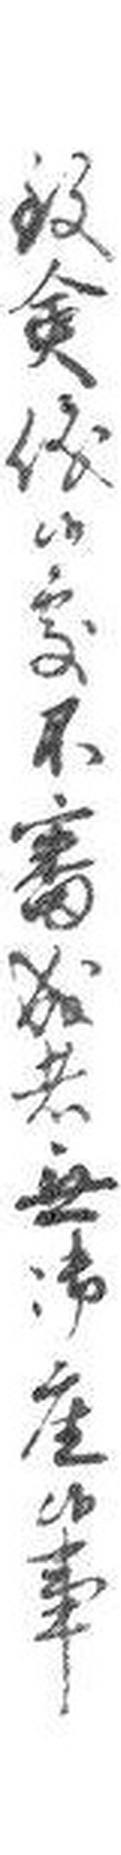致僉議候処不審成者無御座候事
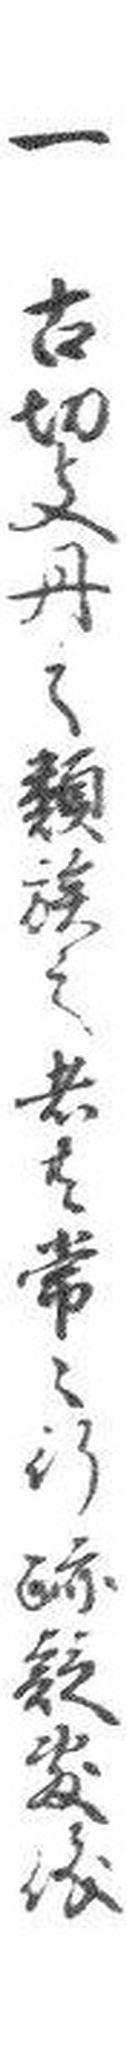一古切支丹之類族之者共常々行跡疑敷儀
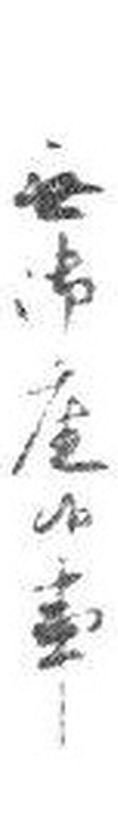無御座候事
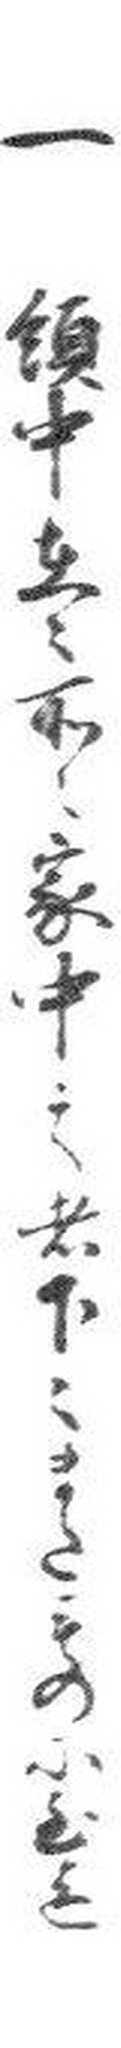一領中在々所々家中之者下々またものに至迄
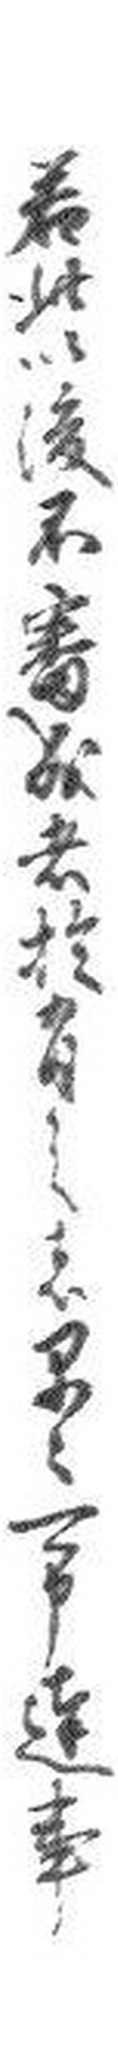若此以後不審成者於有之者可申達事
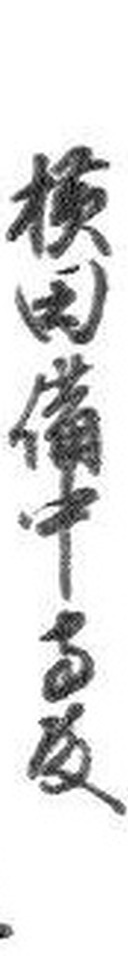横田備中守殿
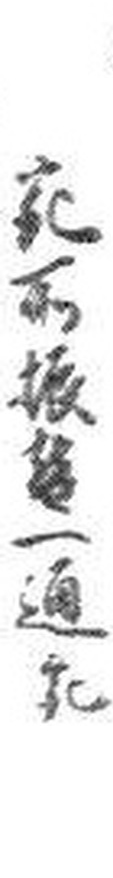宛所振替一通宛
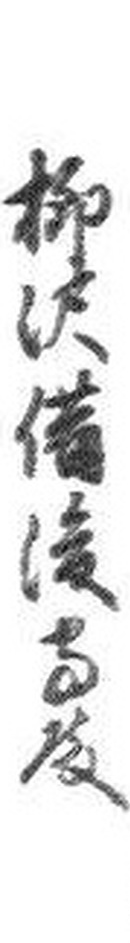柳沢備後守殿
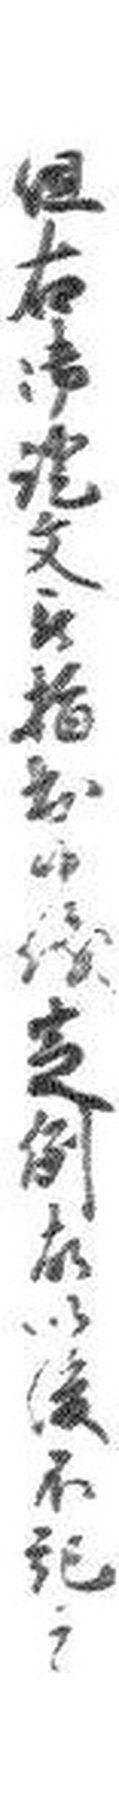但右御証文被指出候儀定例故以後不記之
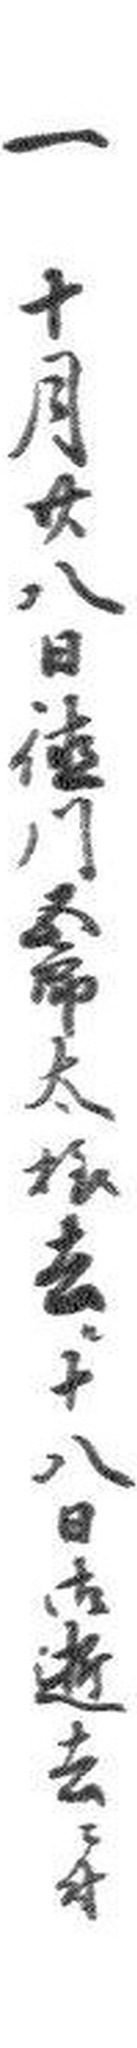一十月廿八日徳川五郎太様去ル十八日ご御逝去ニ付
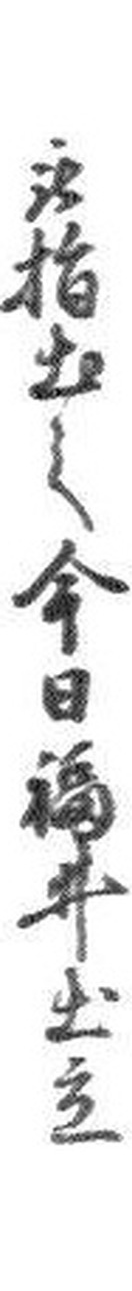被指出之今日福井出立

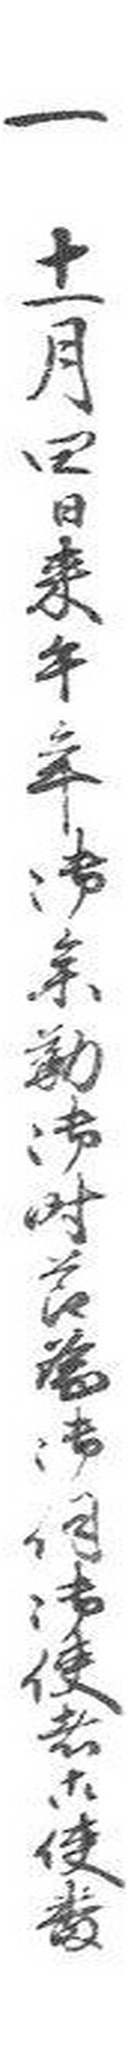一十一月四日来午年御参勤御時節御伺御使者御使番
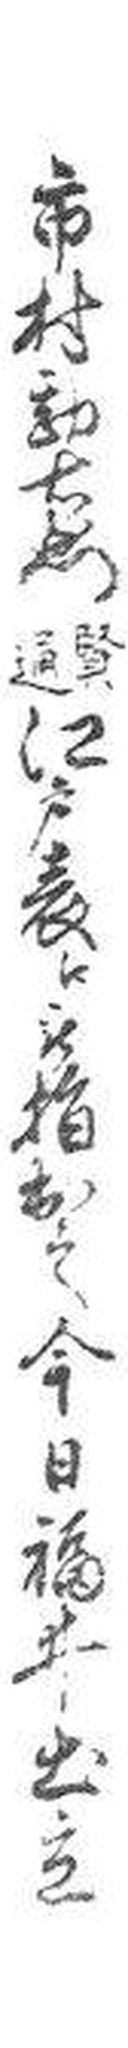市村勘右衛門賢通江戸表江被指出之今日福井出立
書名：家譜 二十九 吉邦公 従正徳二年到正徳三年
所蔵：福井県文書館 Fukui Prefectural Archives
